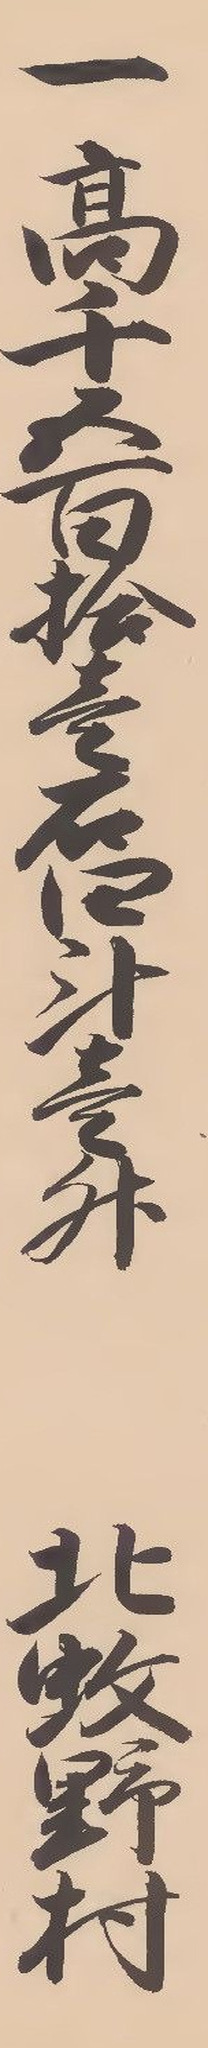一高千五百拾壱石四斗壱升北蚊野村

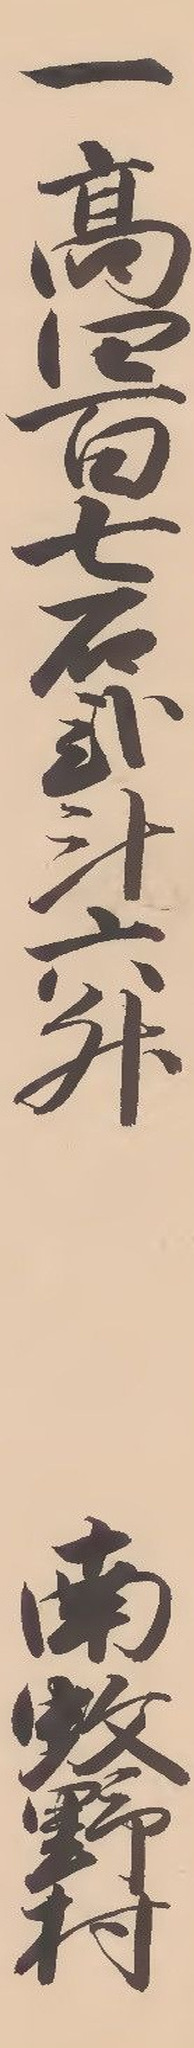一高四百七石弐斗六升南蚊野村
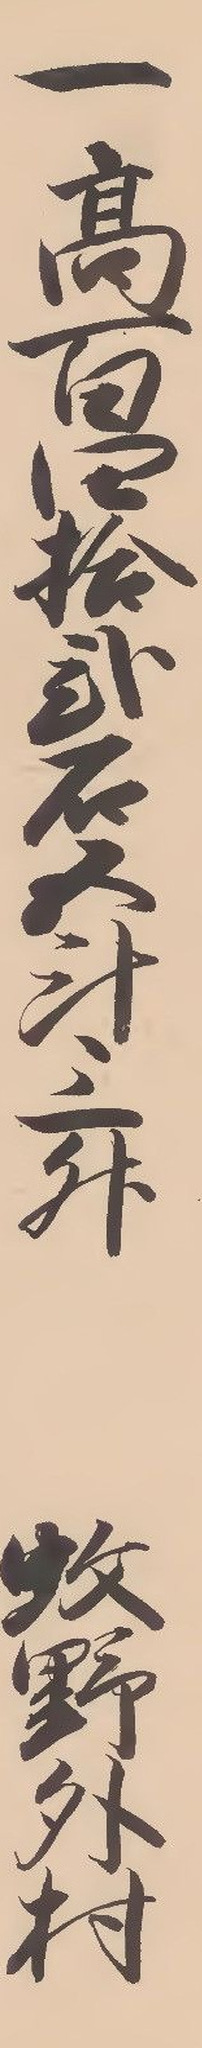一高百四拾弐石五斗三升蚊野外村
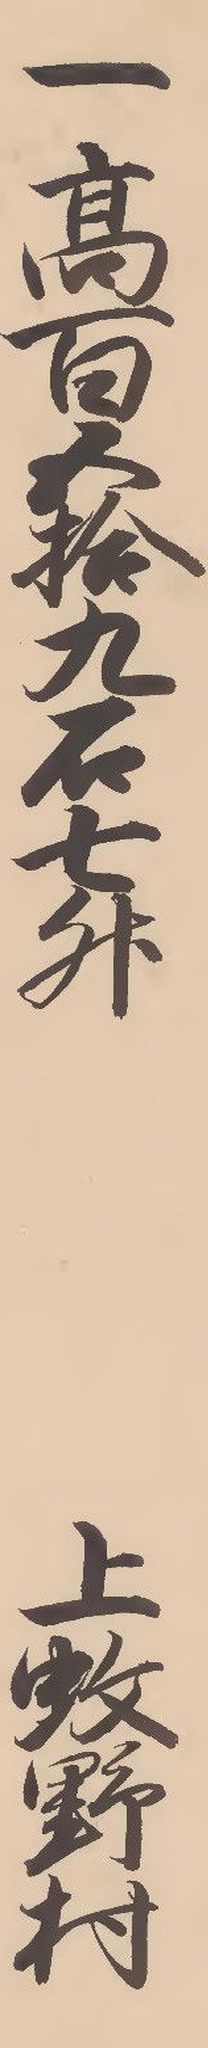一高百五拾九石七升上蚊野村
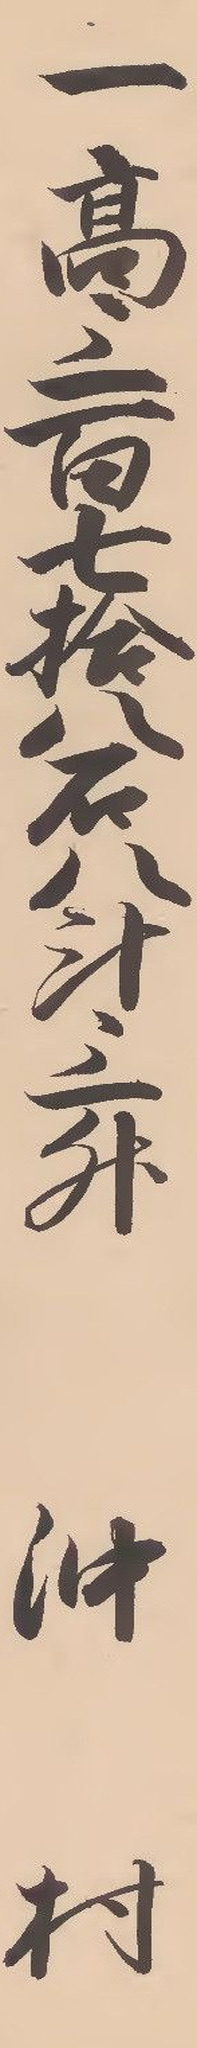一高三百七拾八石八斗三升沖村
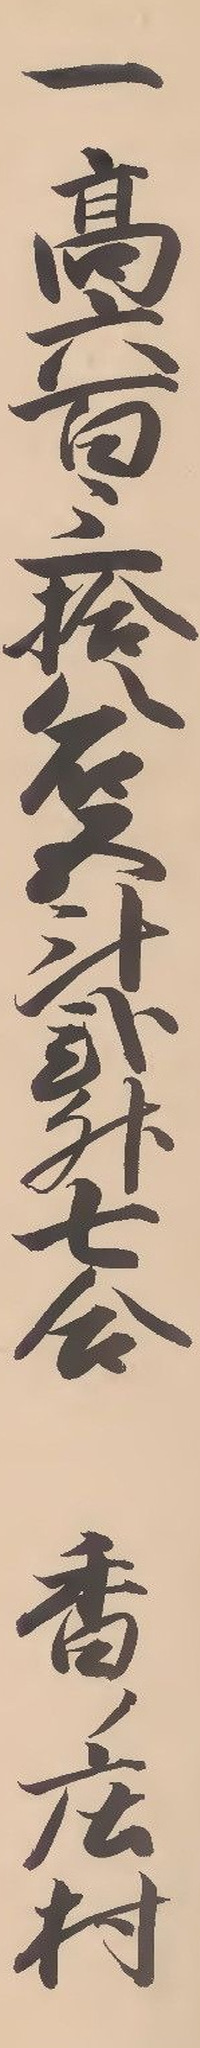一高六百三拾八石五斗弐升七合香ノ庄村
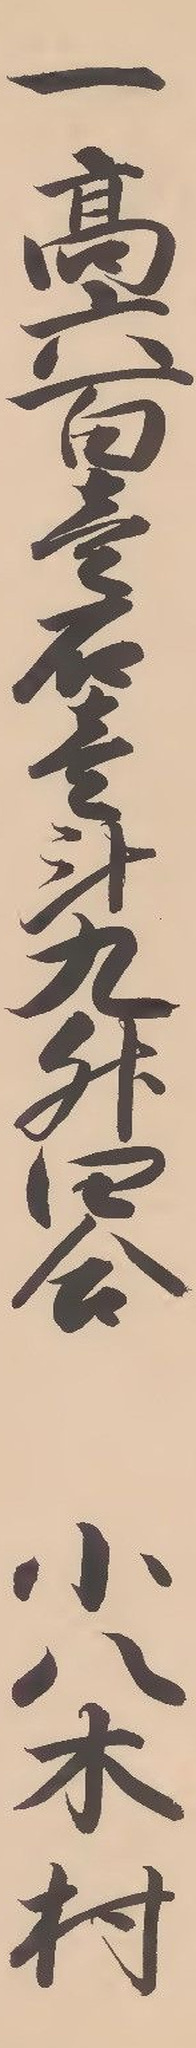一高六百壱石壱斗九升四合小八木村
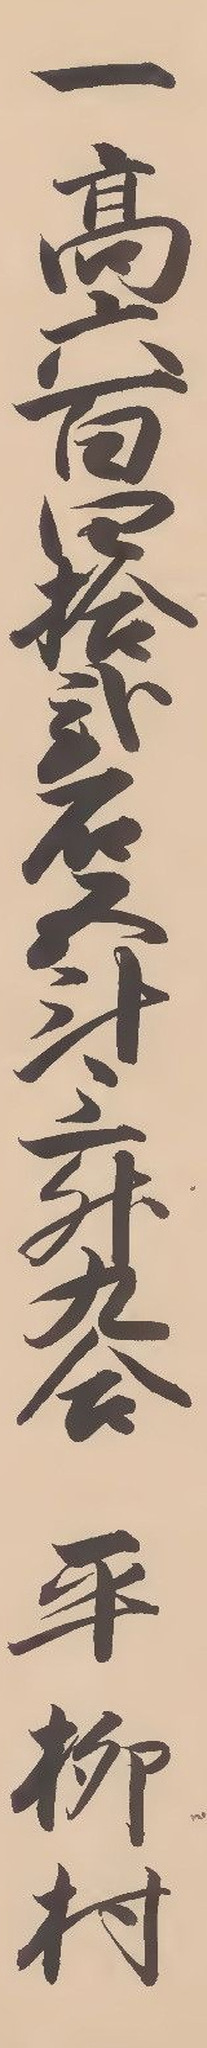一高六百四拾弐石五斗三升九合平柳村
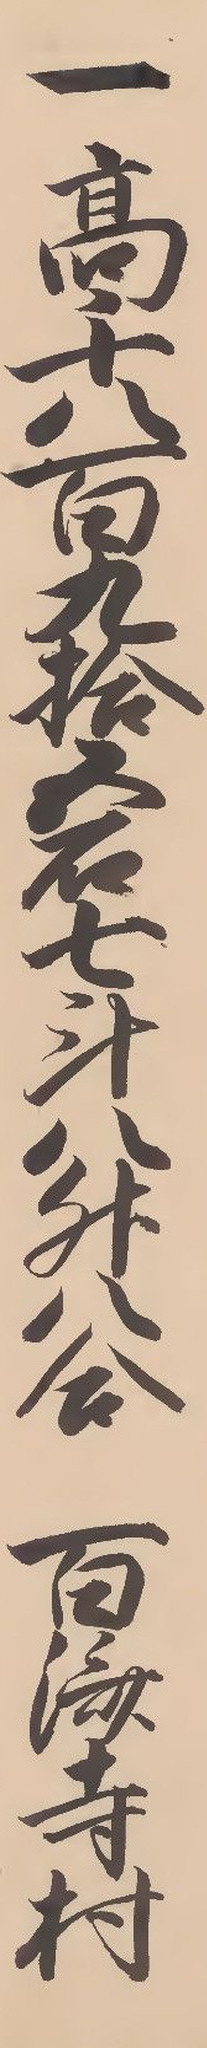一高千八百九拾五石七斗八升八合百済寺村

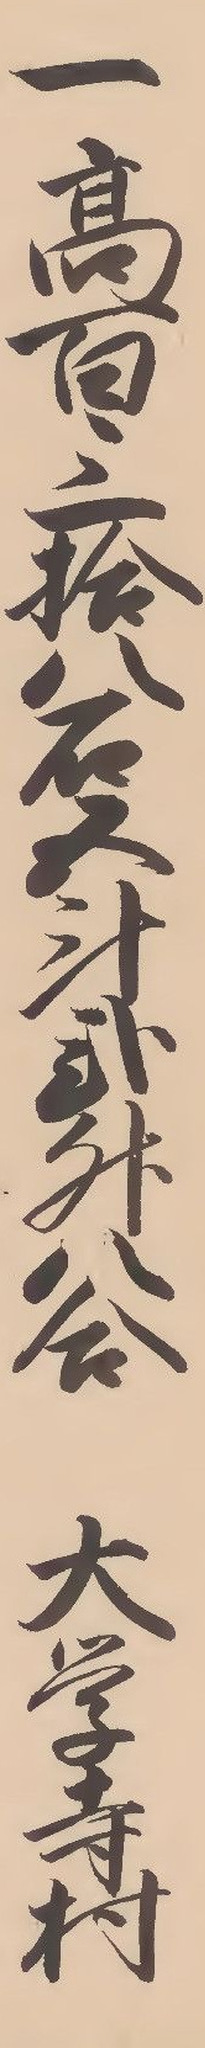一高百三拾八石五斗弐升八合大覚寺村
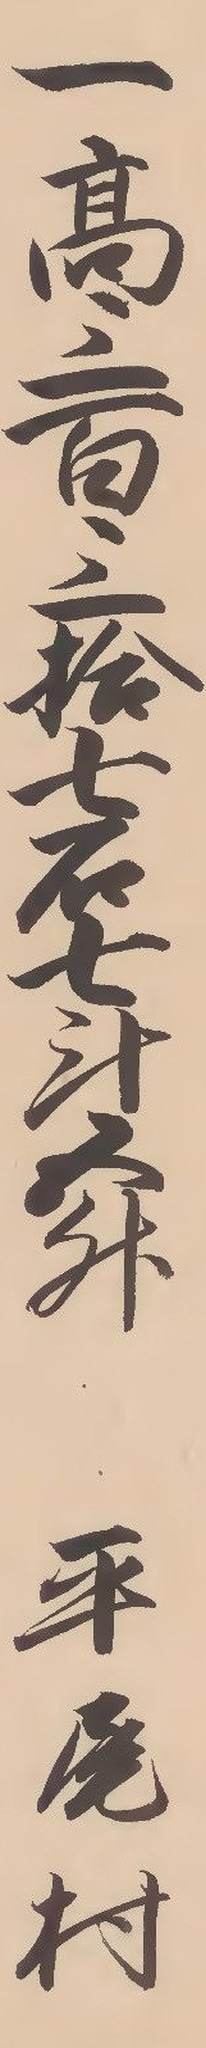一高三百三拾七石七斗五升平尾村
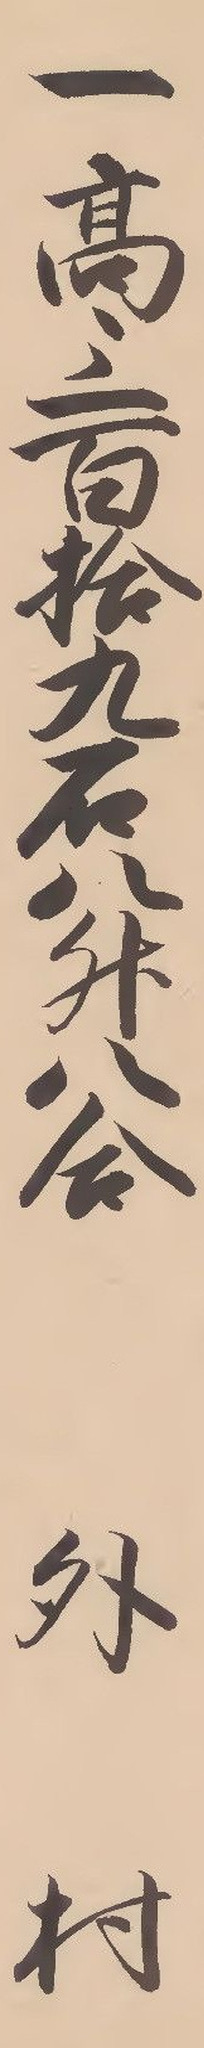一高三百拾九石八升八合外村
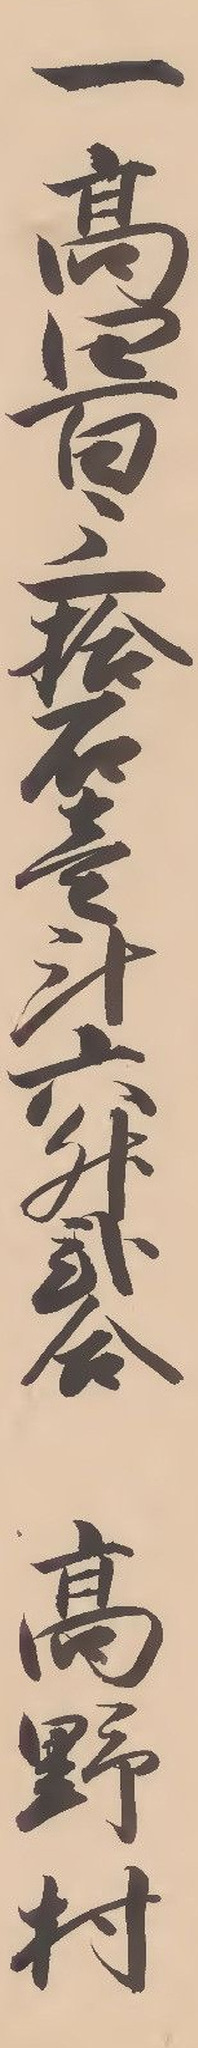一高四百三拾石壱斗六升弐合高野村
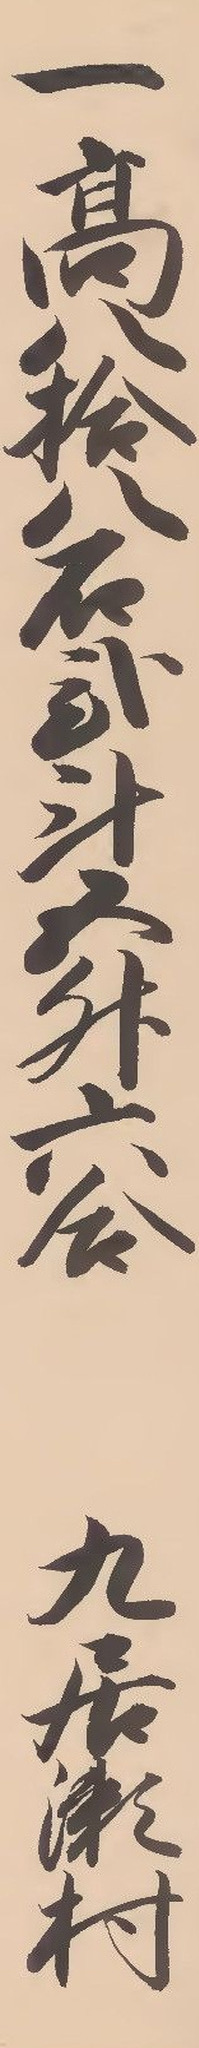一高八拾八石弐斗五升六合九居瀬村
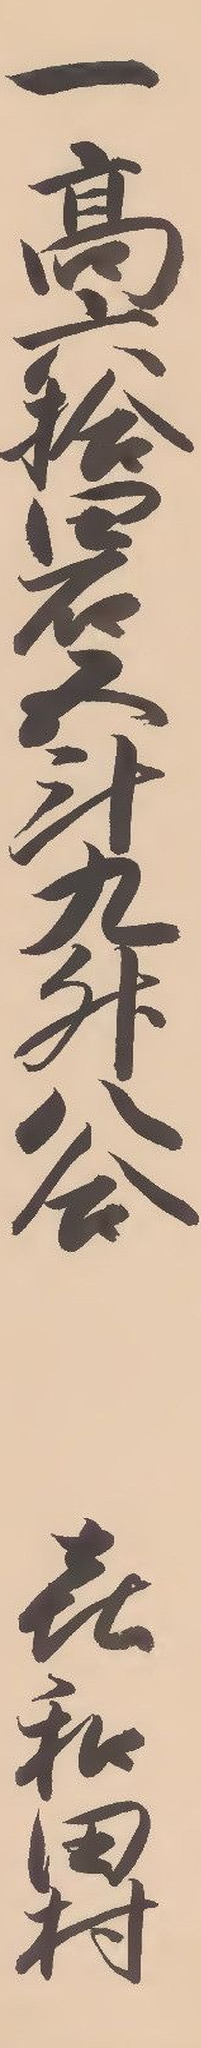一高六拾四石五斗九升八合喜和田村
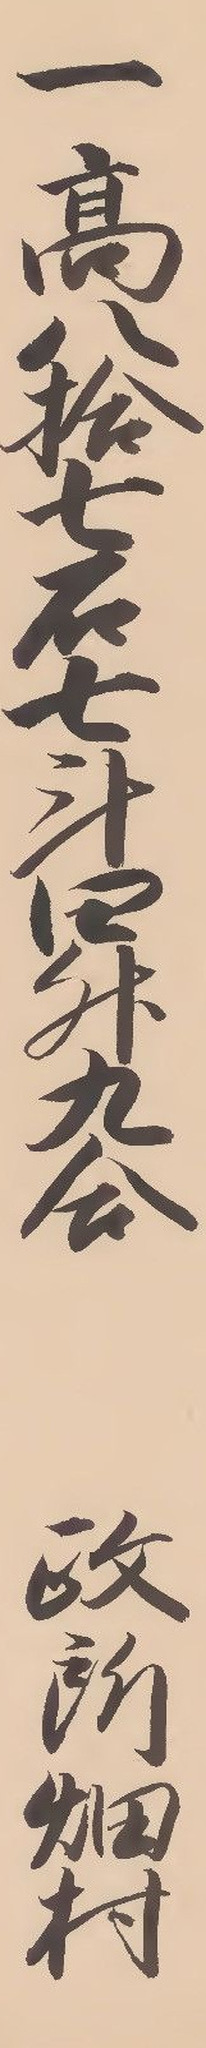一高八拾七石七斗四升九合政所畑村
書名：近江国郷帳
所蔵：国立公文書館 National Archives of Japan
